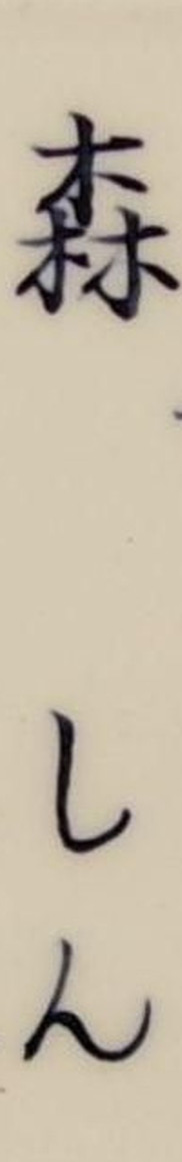森しん
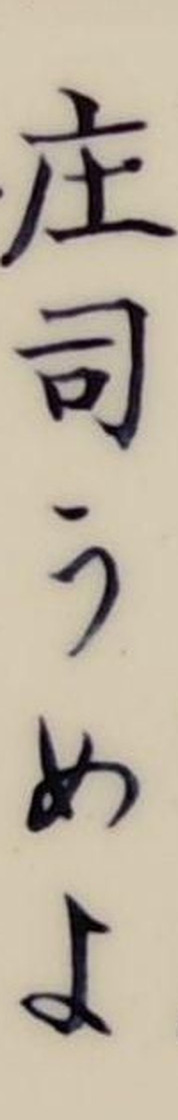庄司うめよ
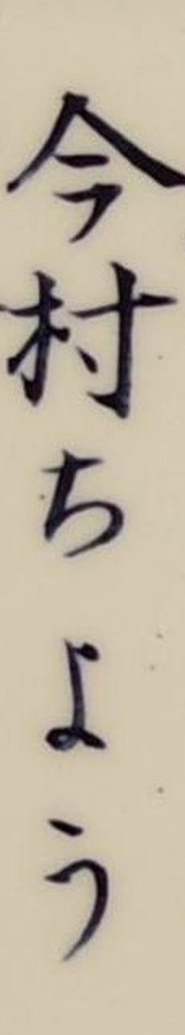今村ちよう
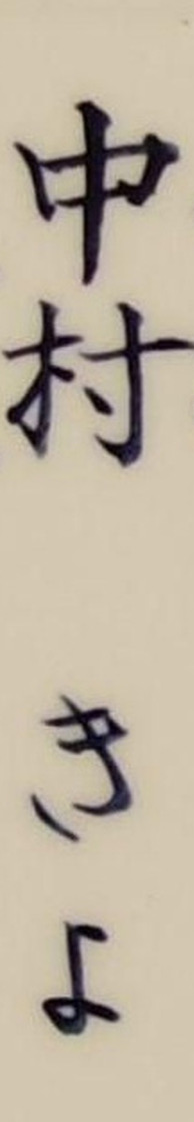中村きよ
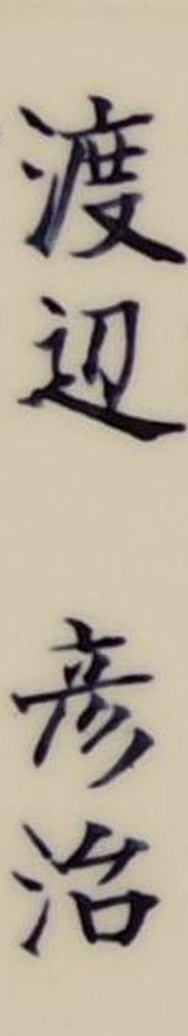渡辺彦治
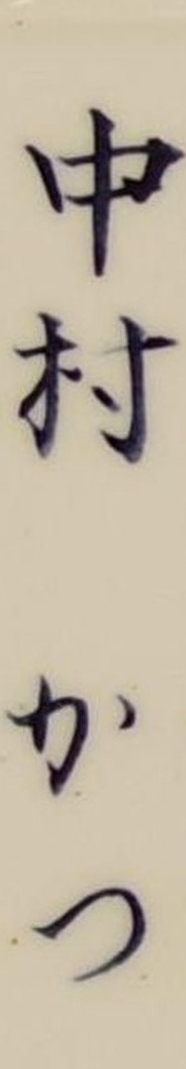中村かつ
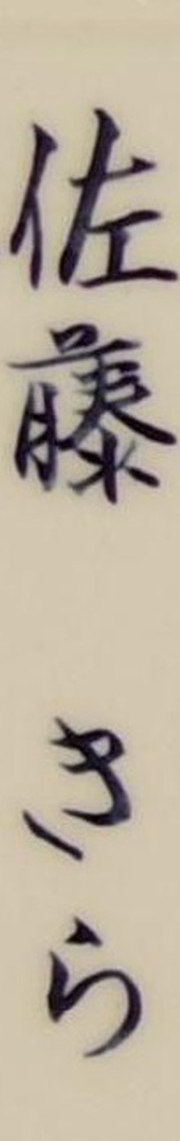佐藤きら
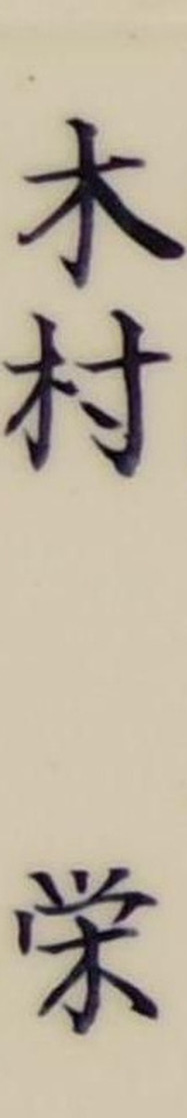木村栄
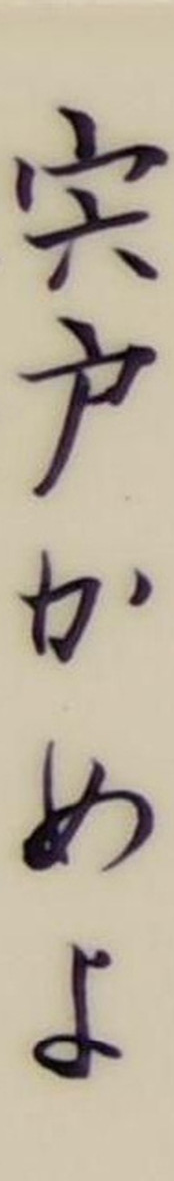宍戸かめよ
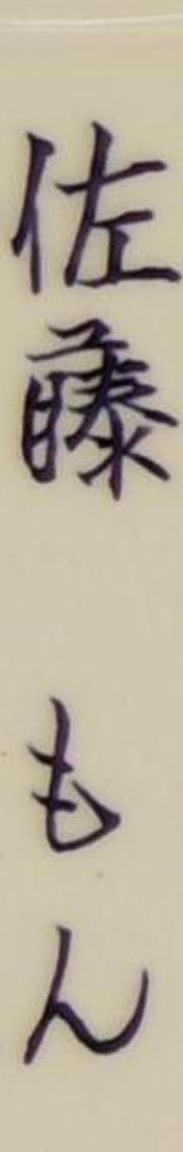佐藤もん
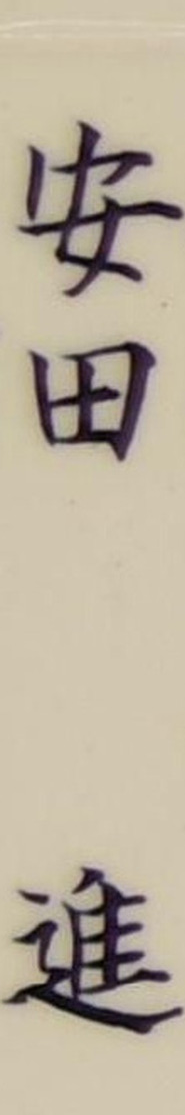安田進
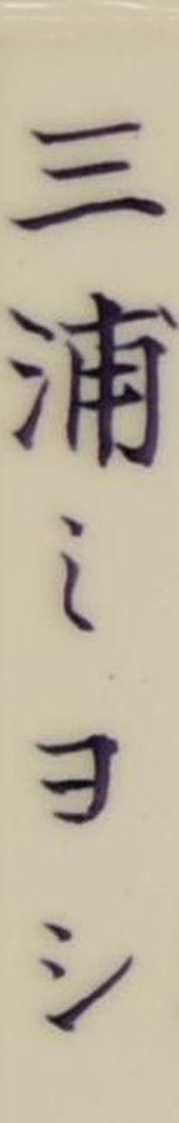三浦ミヨシ

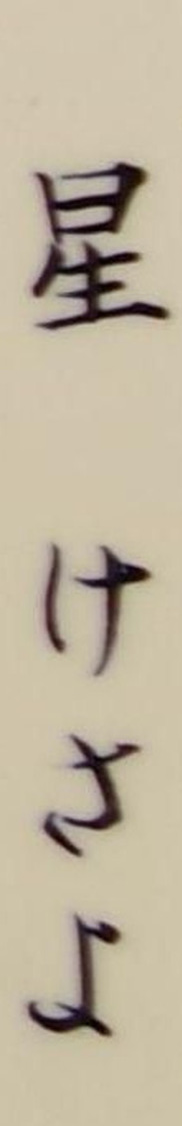星けさよ
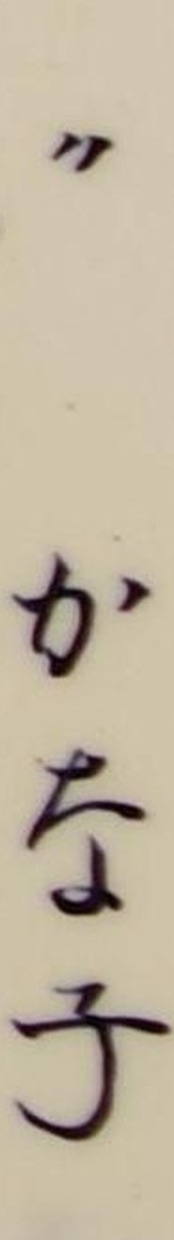かな子
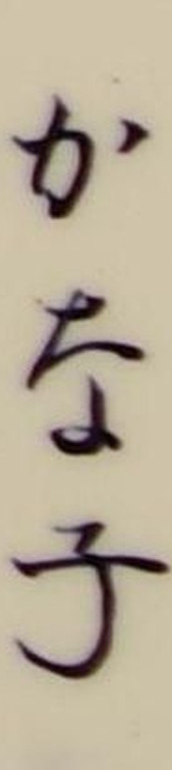かな子
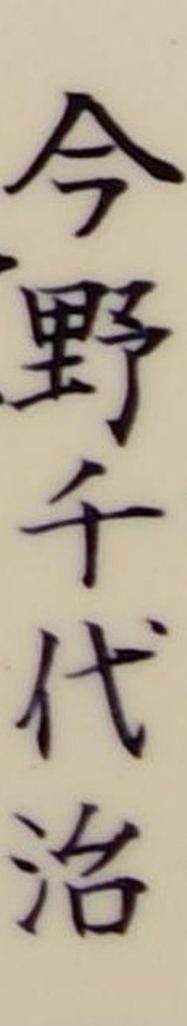今野千代治
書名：A~D
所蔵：koyasan kongobuji
